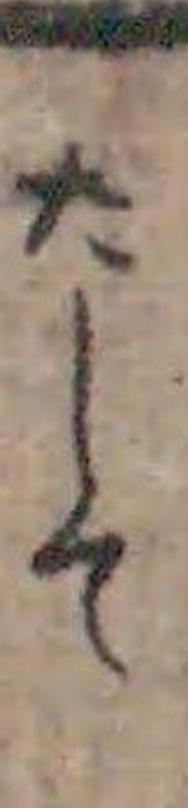たして

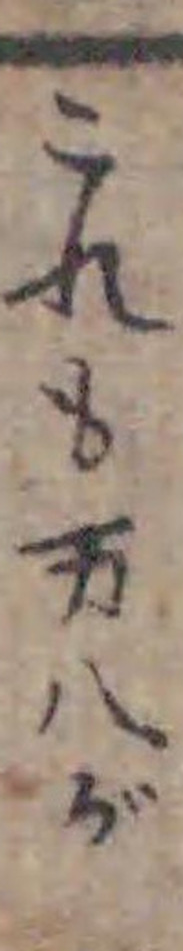これも万八が
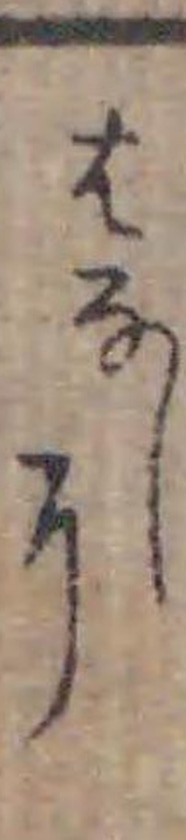はなしに
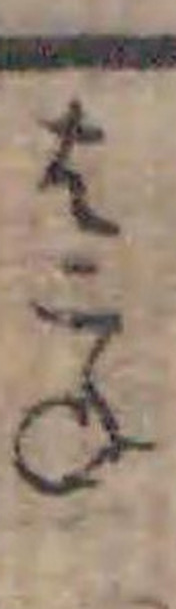はこね
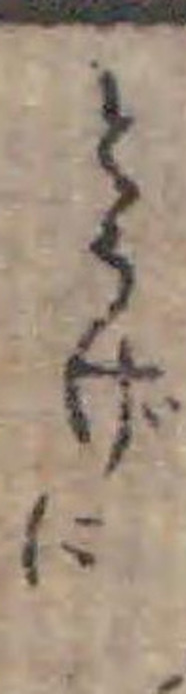とうげに
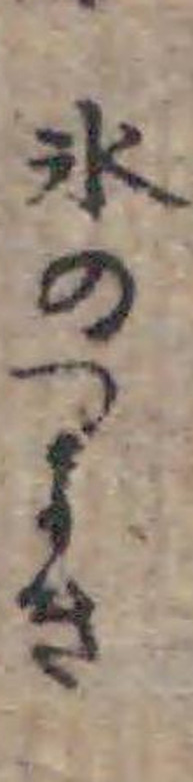氷のつよき
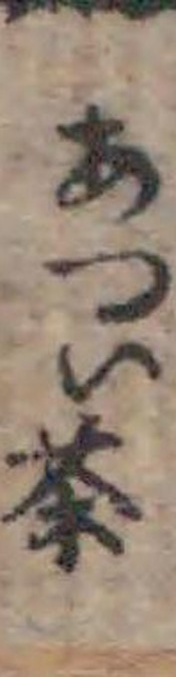あつい茶
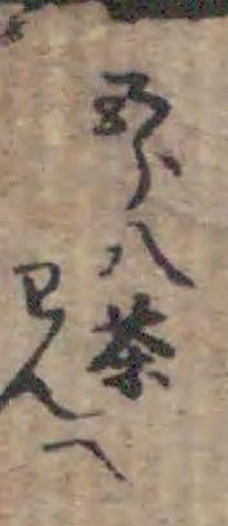五郎八茶
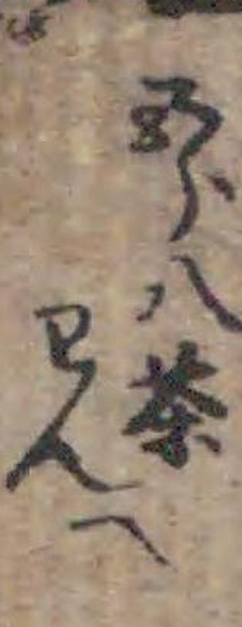わんへ
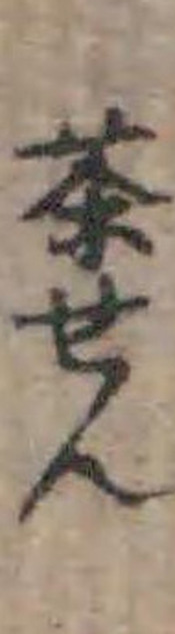茶せん
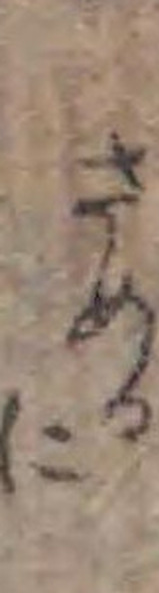さめる
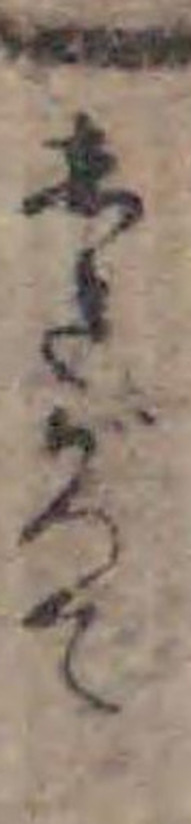したがつて
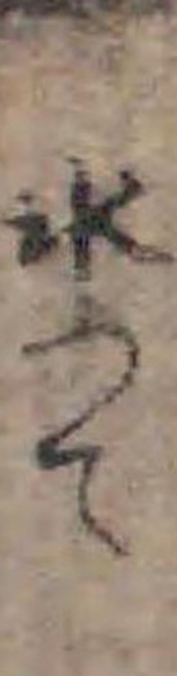氷つて
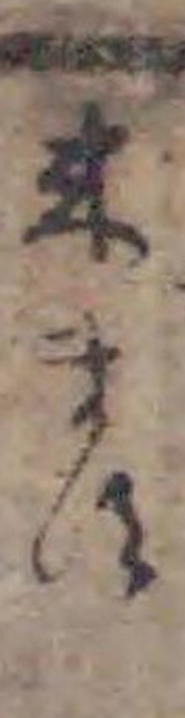来ます
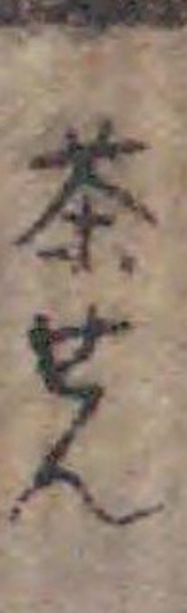茶せん
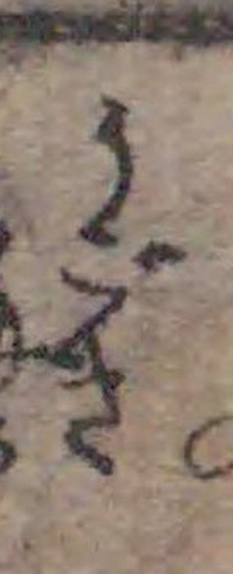うごき
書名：虚言八百万八伝 : 3巻
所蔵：国立国会図書館 National Diet Library, JAPAN
